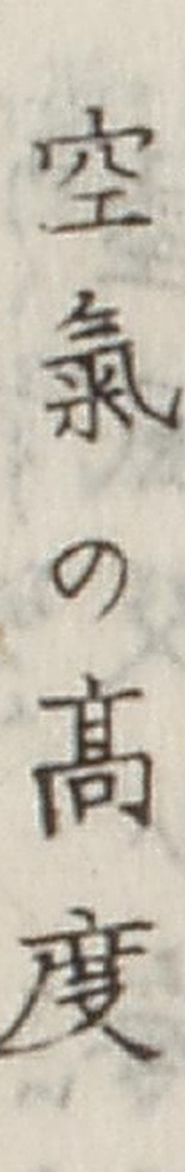空気の高度
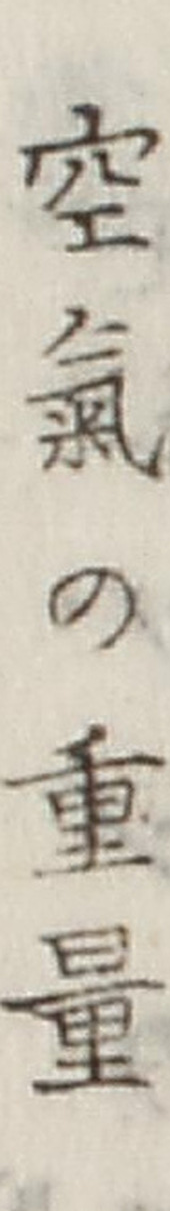空気の重量
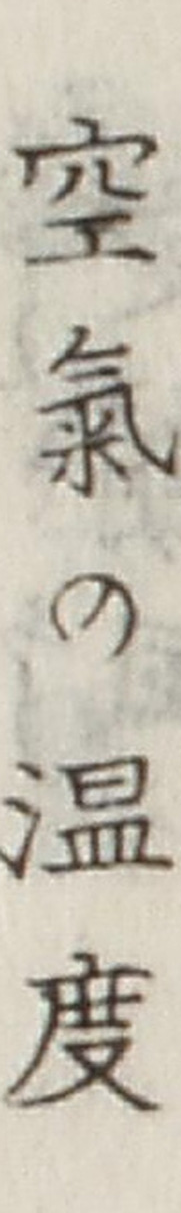空気の温度
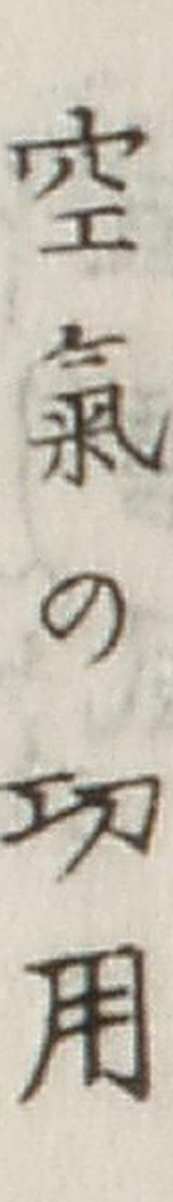空気の功用
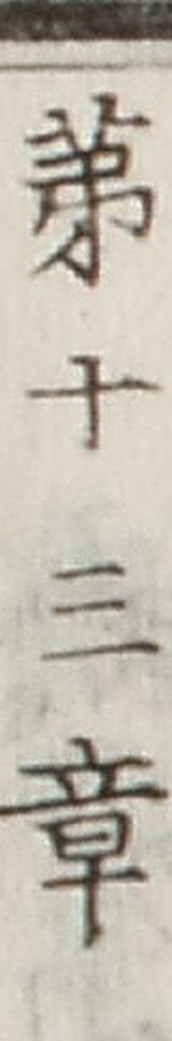第十三章
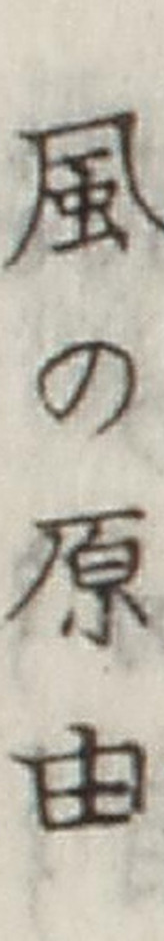風の原由
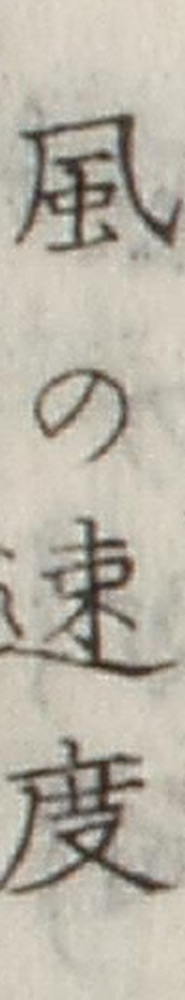風の速度

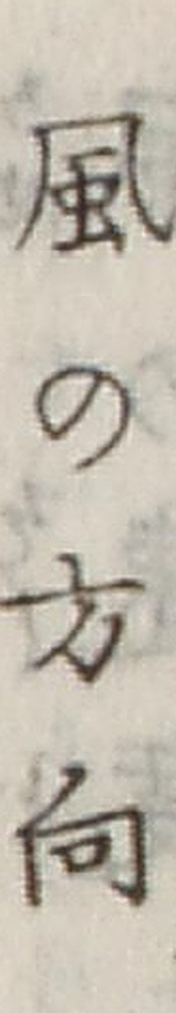風の方向
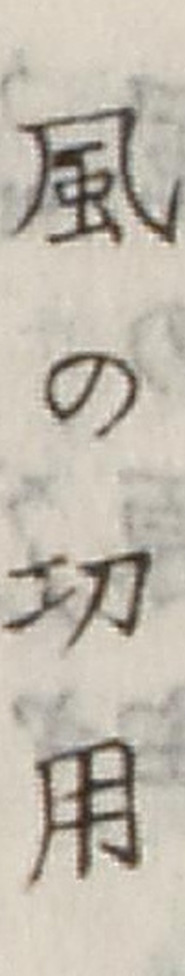風の功用
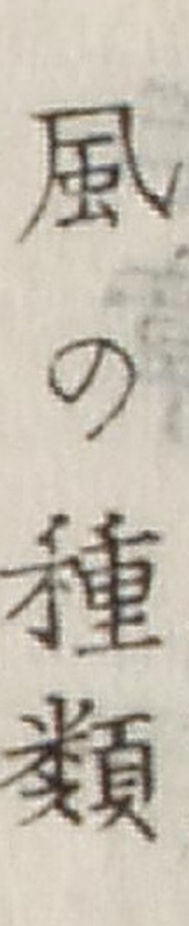風の種類
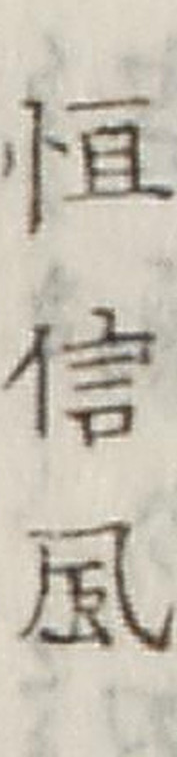恒信風
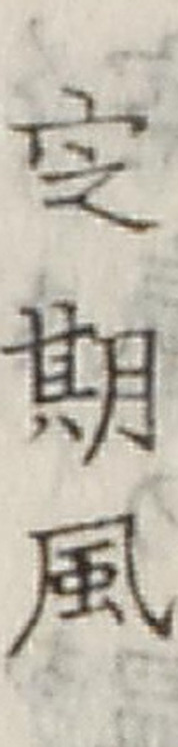定期風
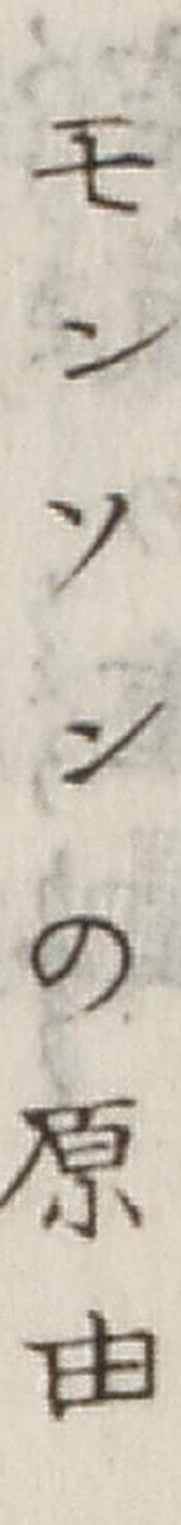モンソンの原由
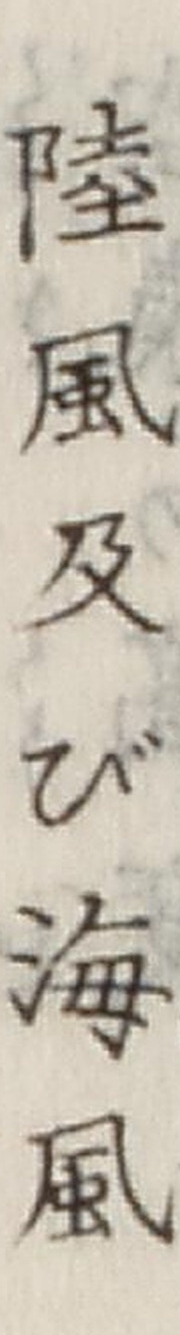陸風及び海風
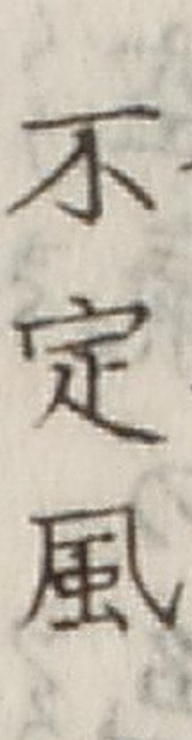不定風
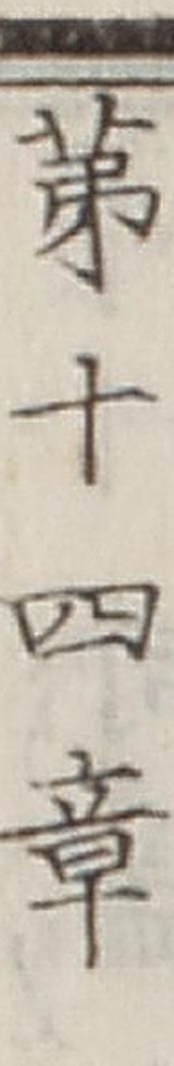第十四章
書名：訓蒙　天然地理學　上
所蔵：東京大学地震研究所図書室 Earthquake Research Institute Library, The University of Tokyo, JAPAN
